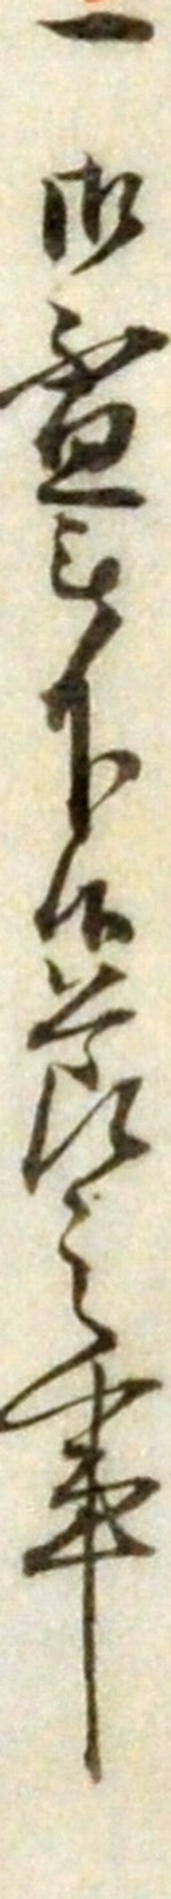一御盃被下候節之事

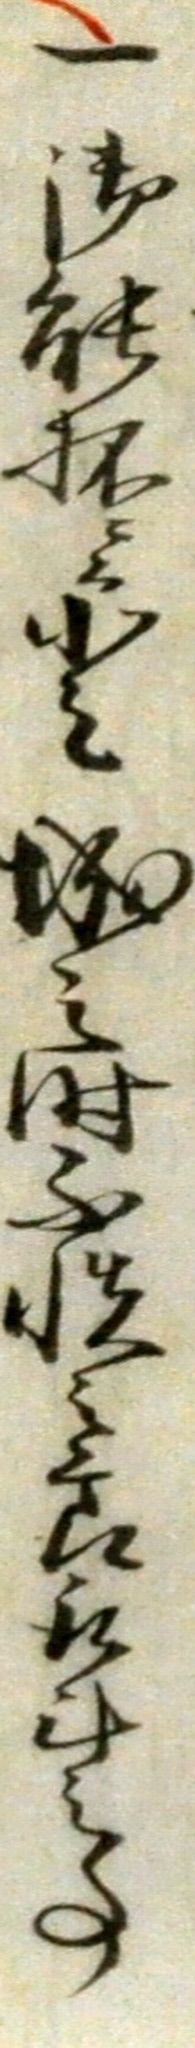一御能抔にて登城之時不快之節取斗之事
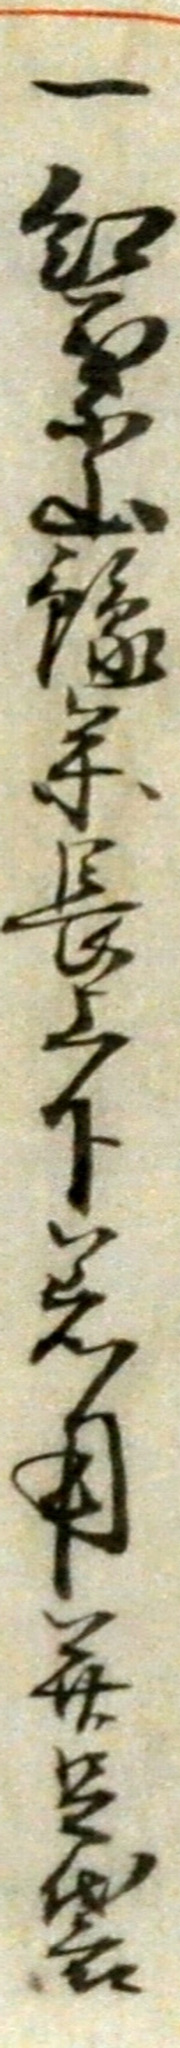一紅葉山予参長上下着用并足袋
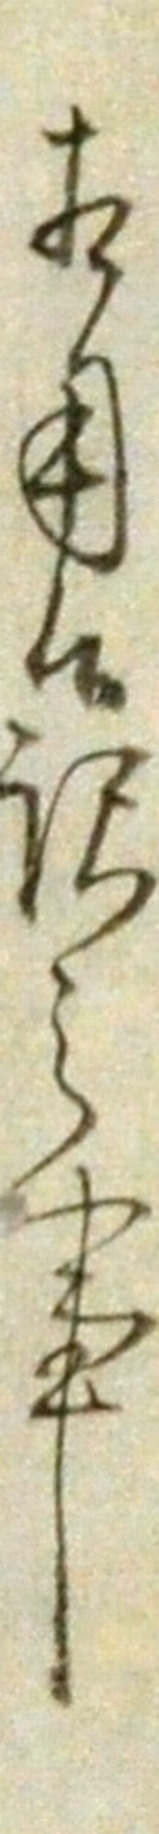相用候訳之事
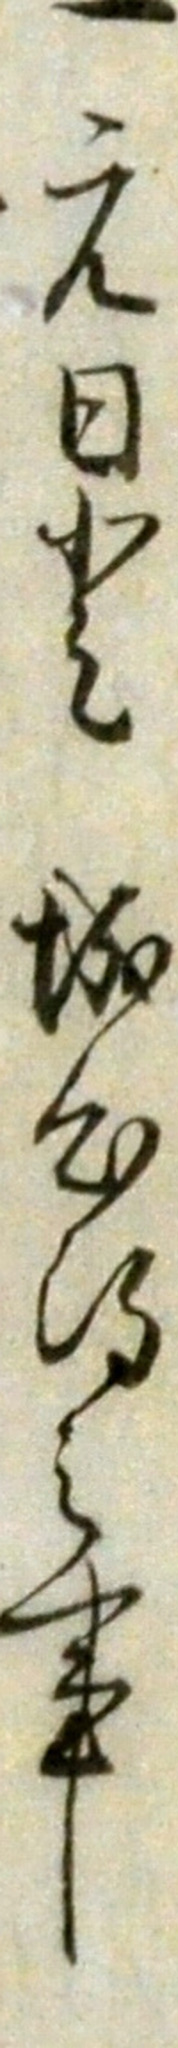一元日登城心得之事
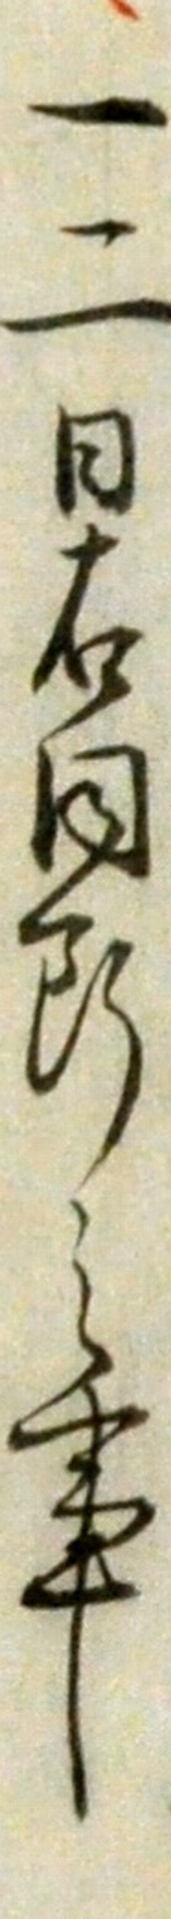一二日右同断之事
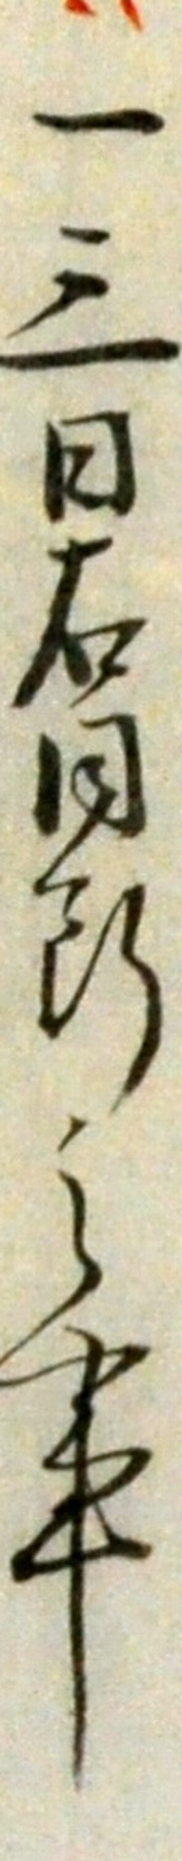一三日右同断之事
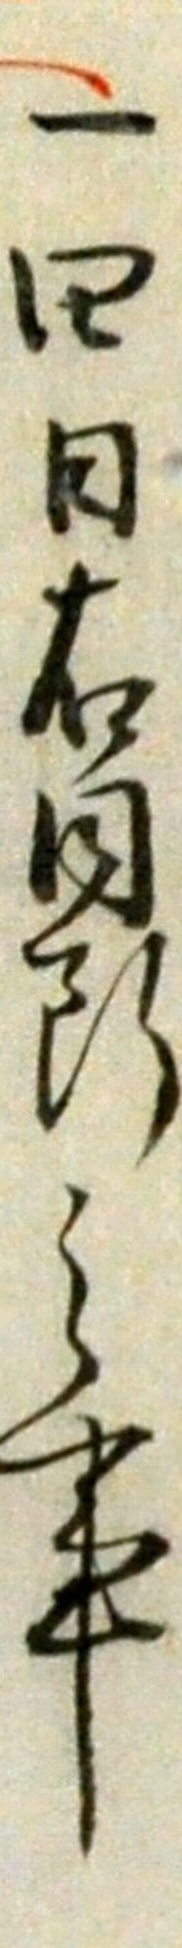一四日右同断之事
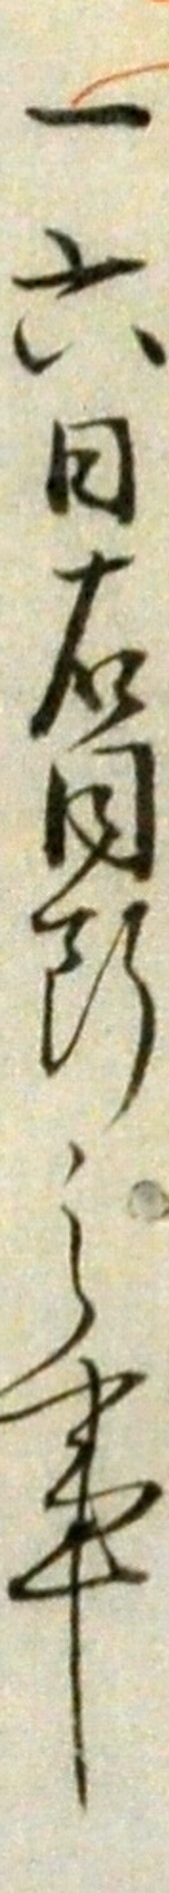一六日右同断之事
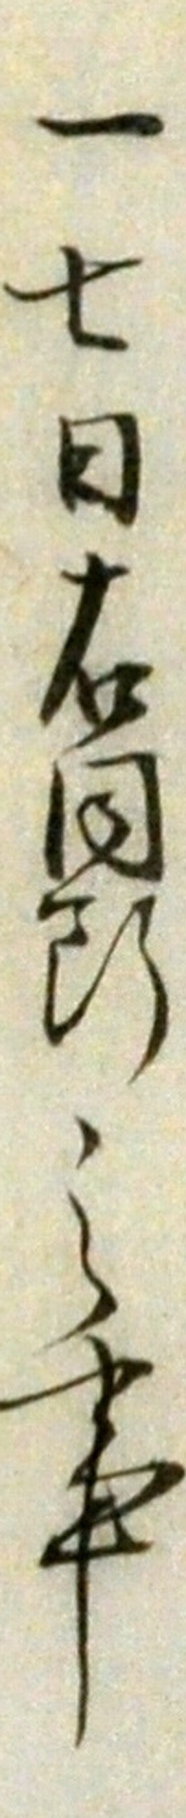一七日右同断之事
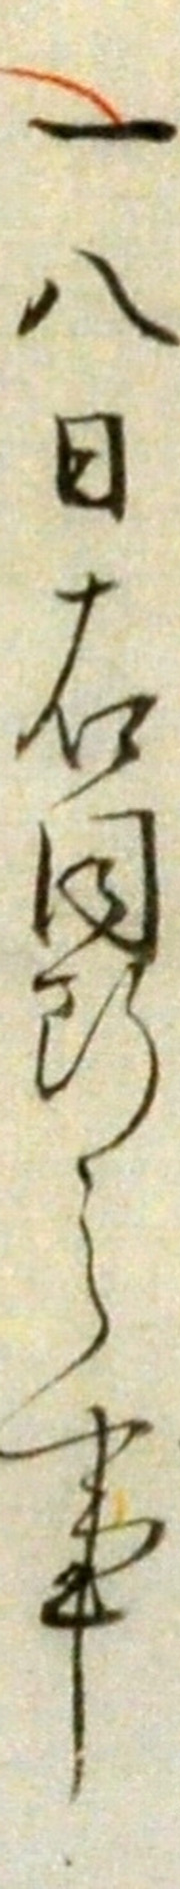一八日右同断之事
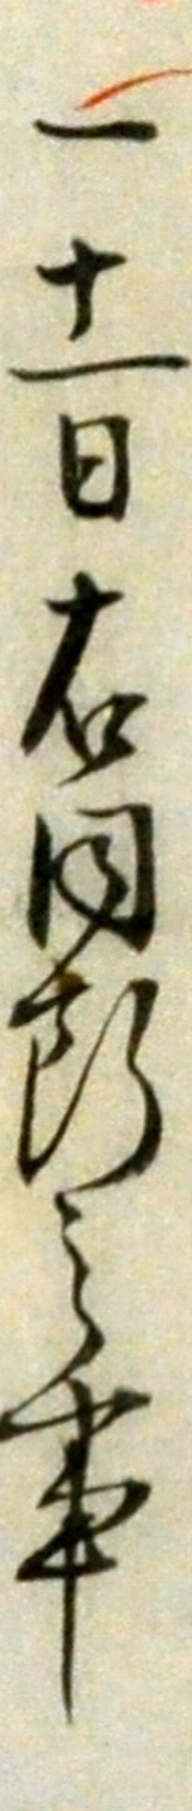一十一日右同断之事
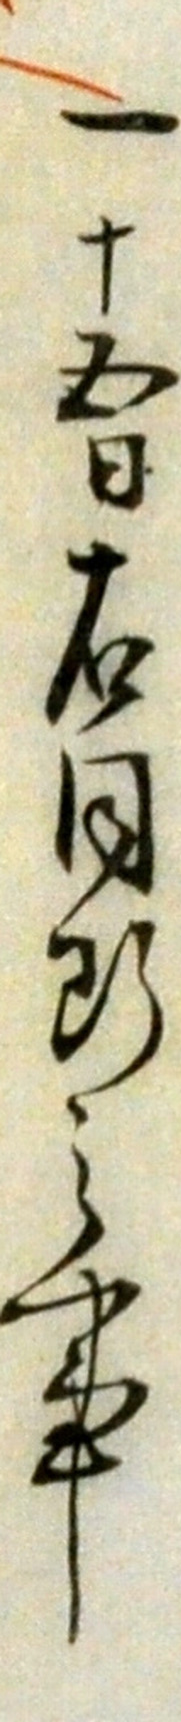一十五日右同断之事
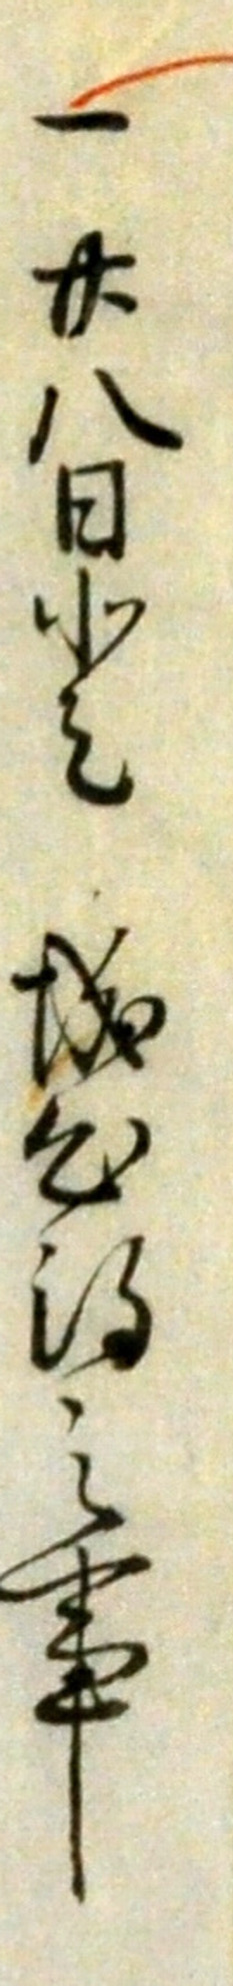一廿八日登城心得之事
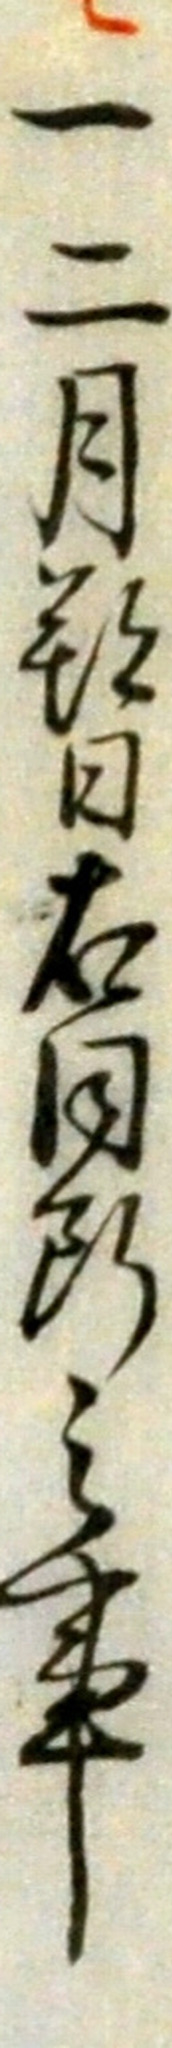一二月朔日右同断之事
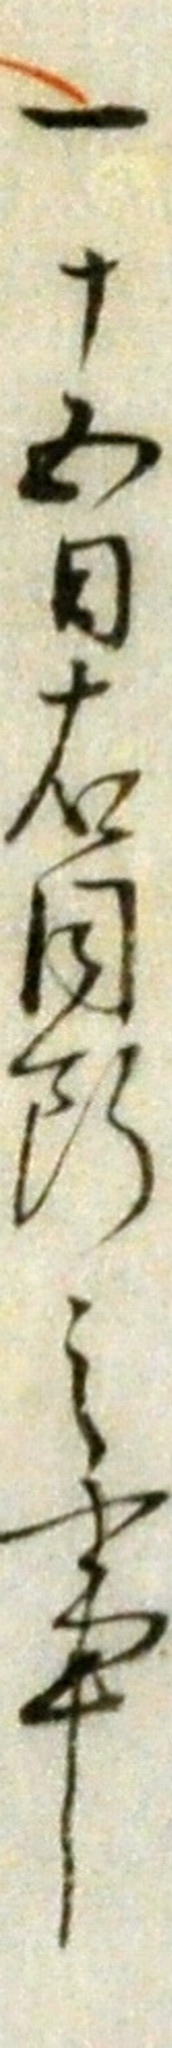一十五日右同断之事
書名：申合帳〔一括〕
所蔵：伊那市立高遠町図書館・合同会社AMANE
